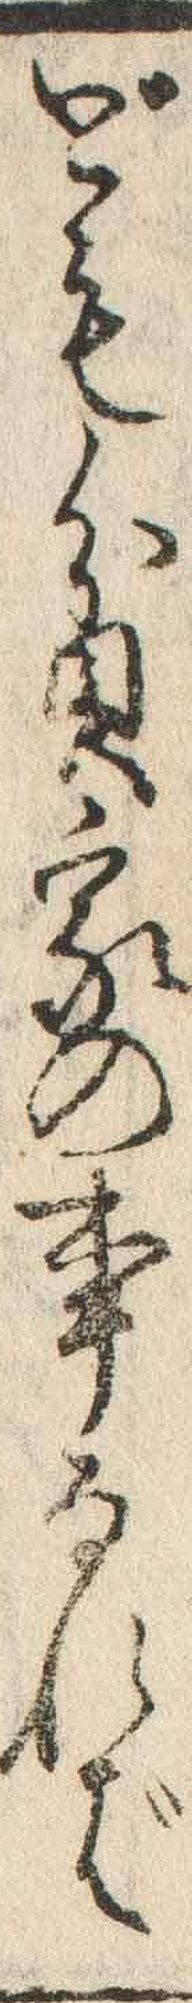ども貧家の事なれば
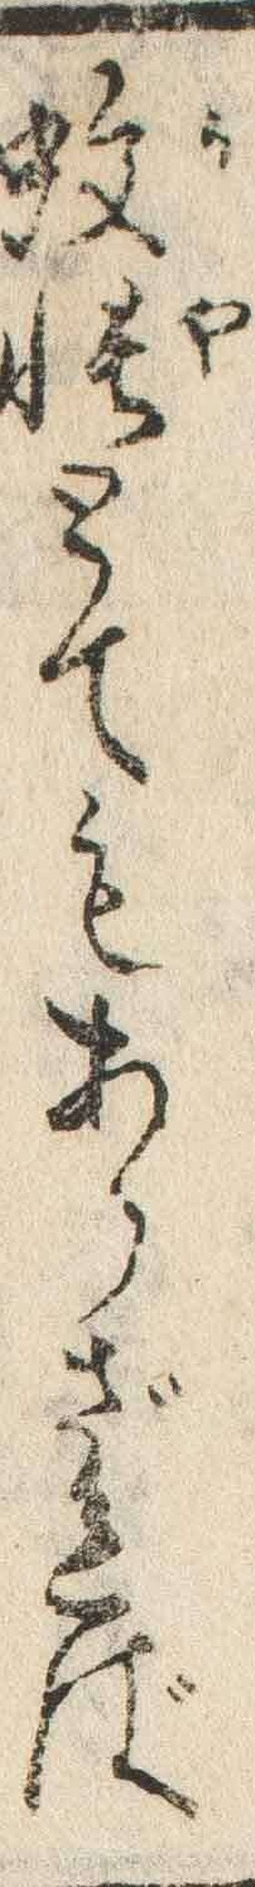蚊帳とてもあらざれば
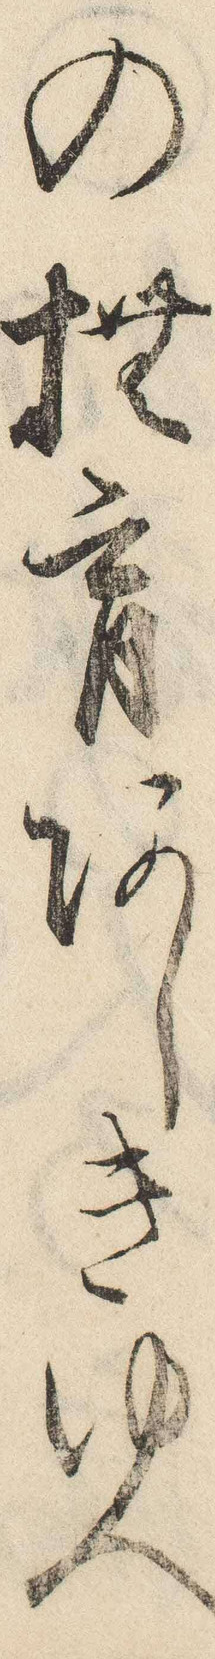の撫育あしきゆへ
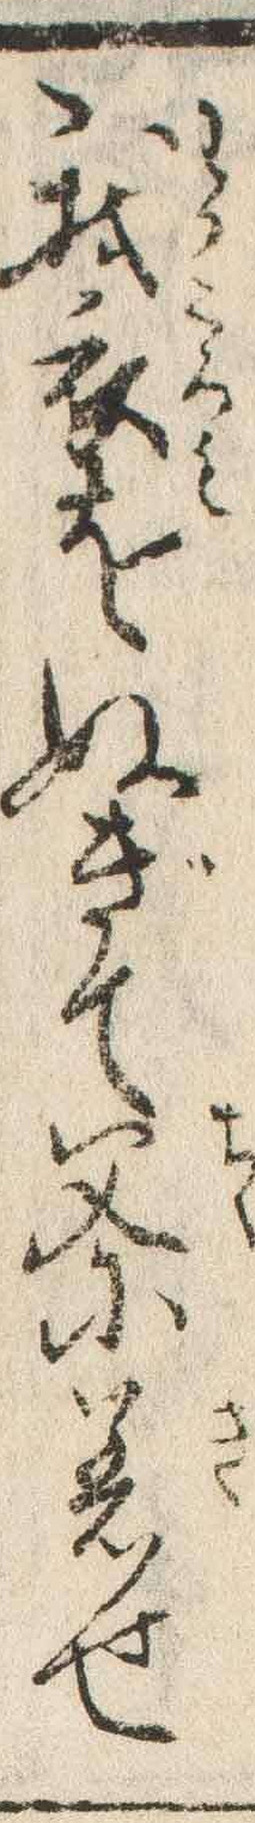我衣をぬぎて父に着せ
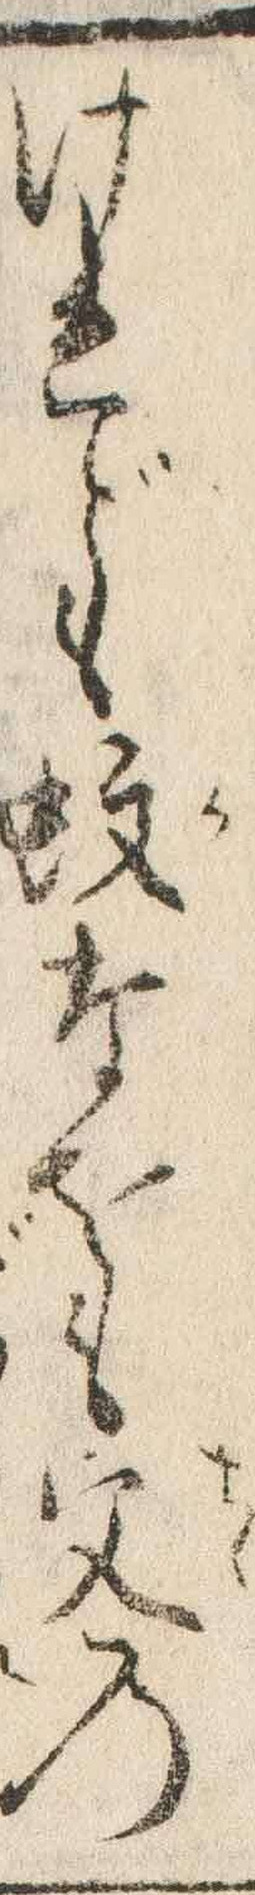けれども蚊なをも父の
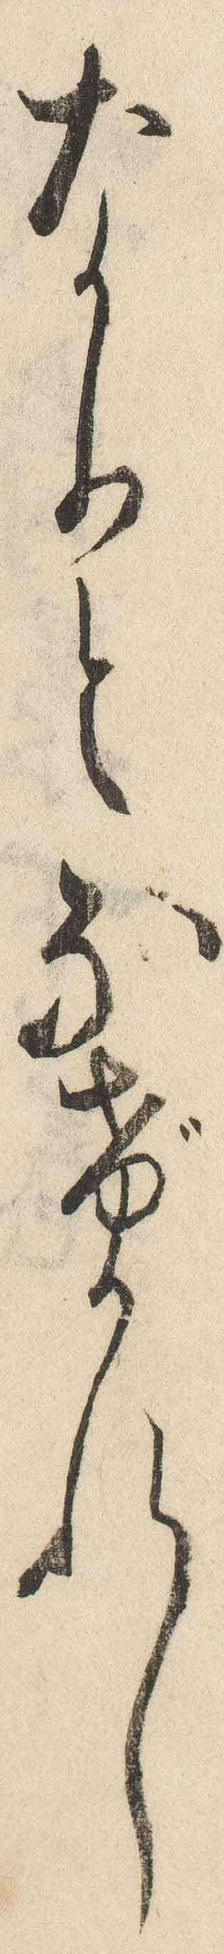なりとなげかれし
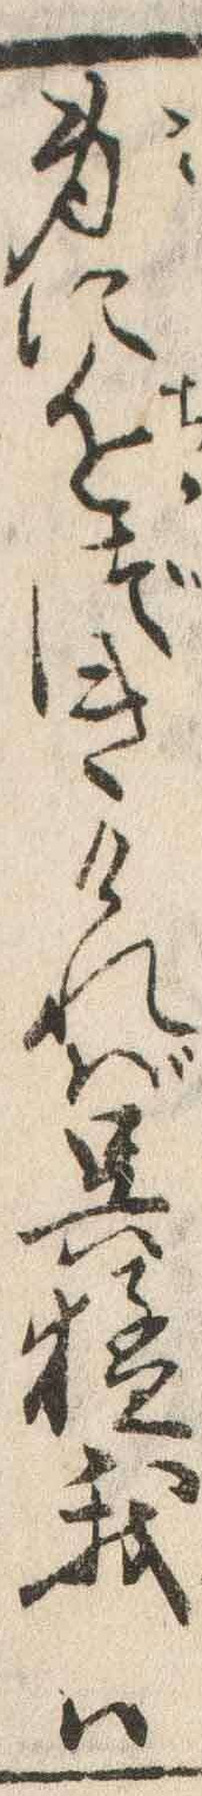身に近づきければ呉猛我は
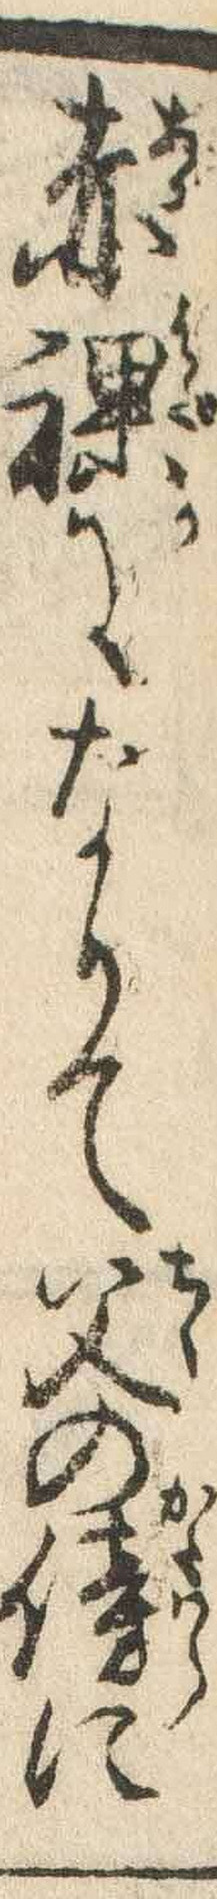赤裸になりて父の傍に
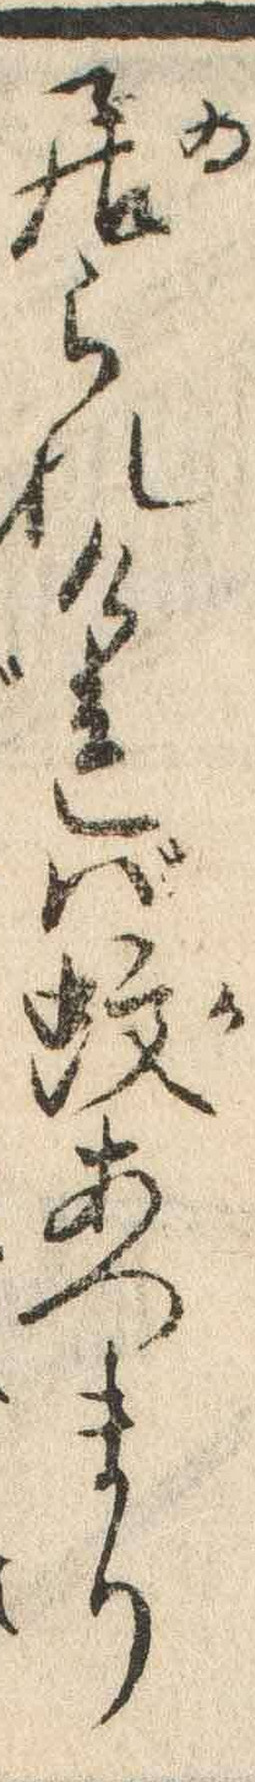居られければ蚊あつまり
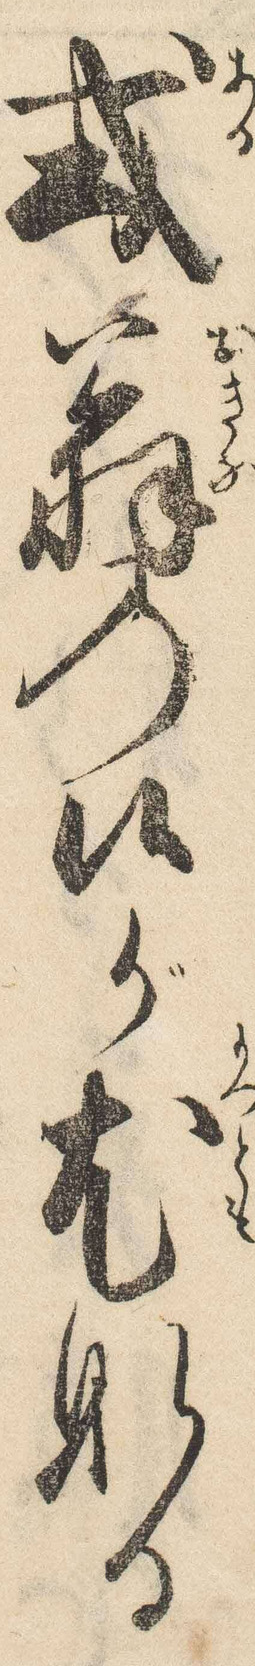或翁の候が尤なる
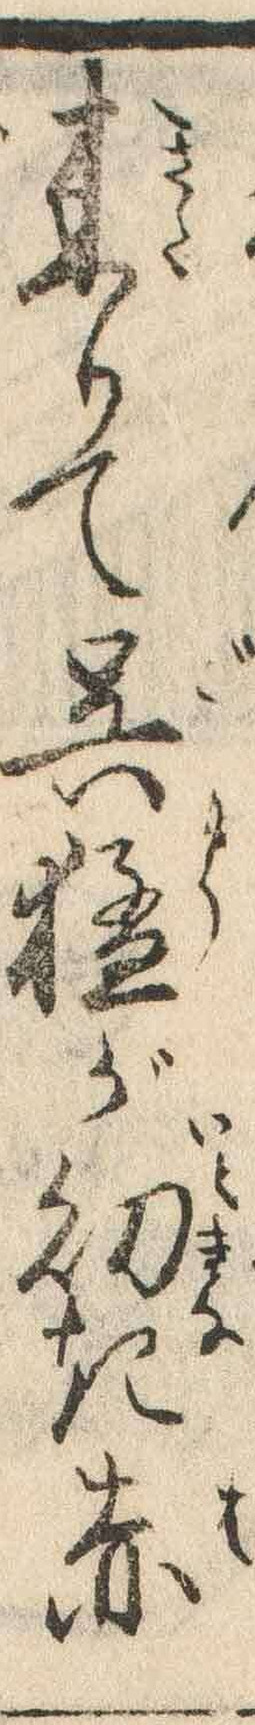来りて呉猛が幼き赤
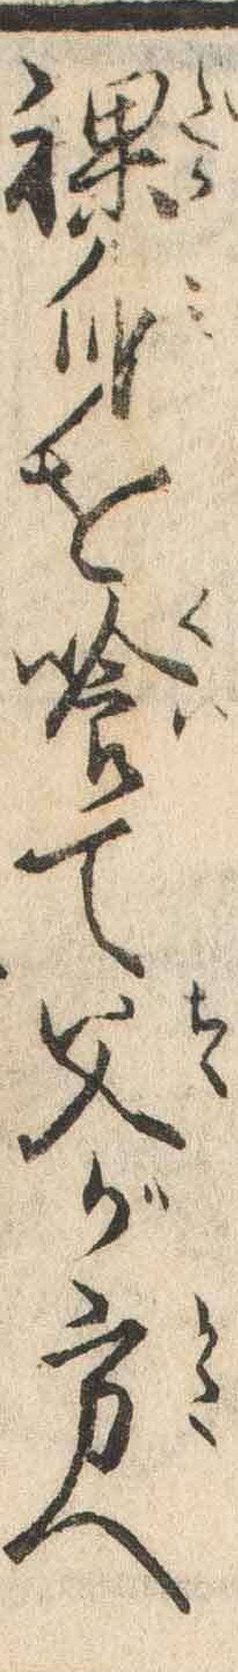裸身を喰て父が方へ
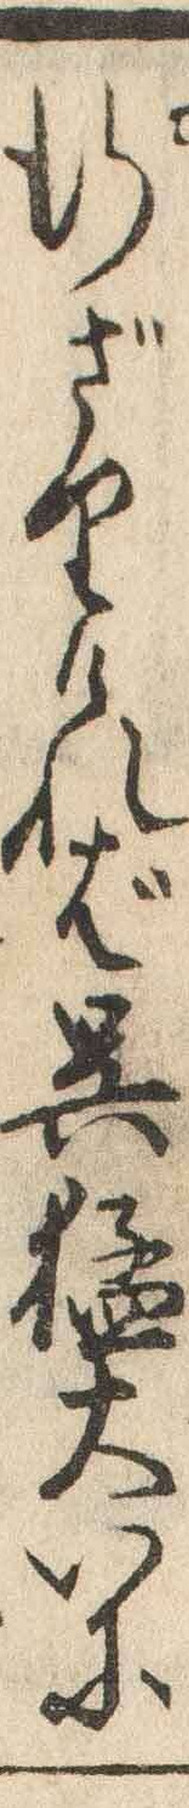行ざりければ呉猛大いに
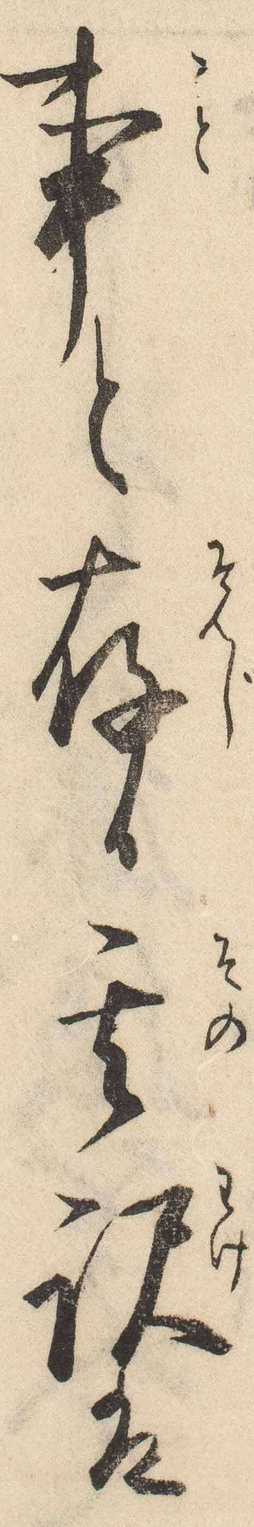事と存候其訳は
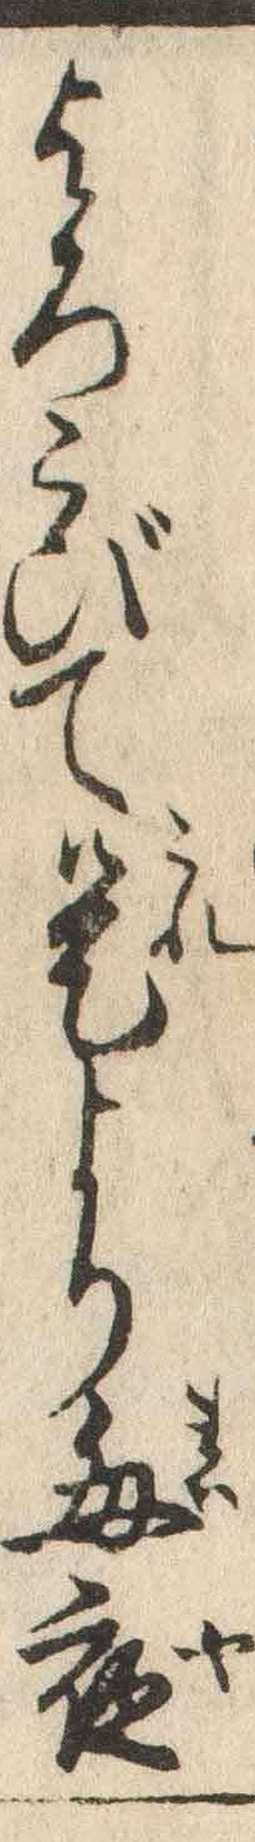よろこびて是より毎夜
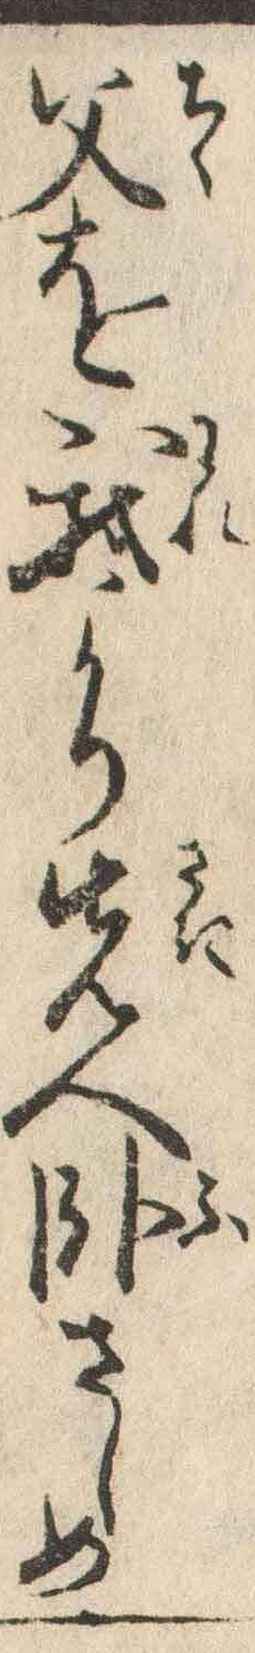父を我より先へ臥さしめ
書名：撫育草
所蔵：東京学芸大学附属図書館 国文学研究資料館
